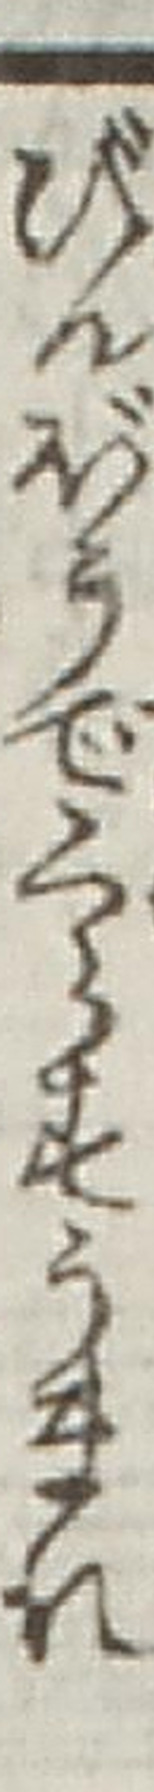びんぼうでくらすうまれ
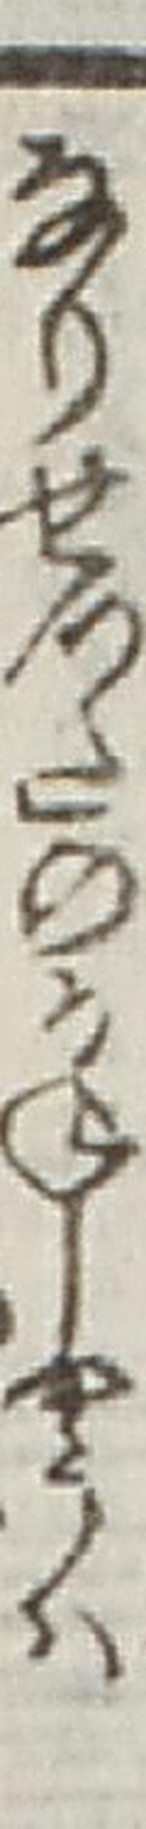なりせつたのかねしやうは
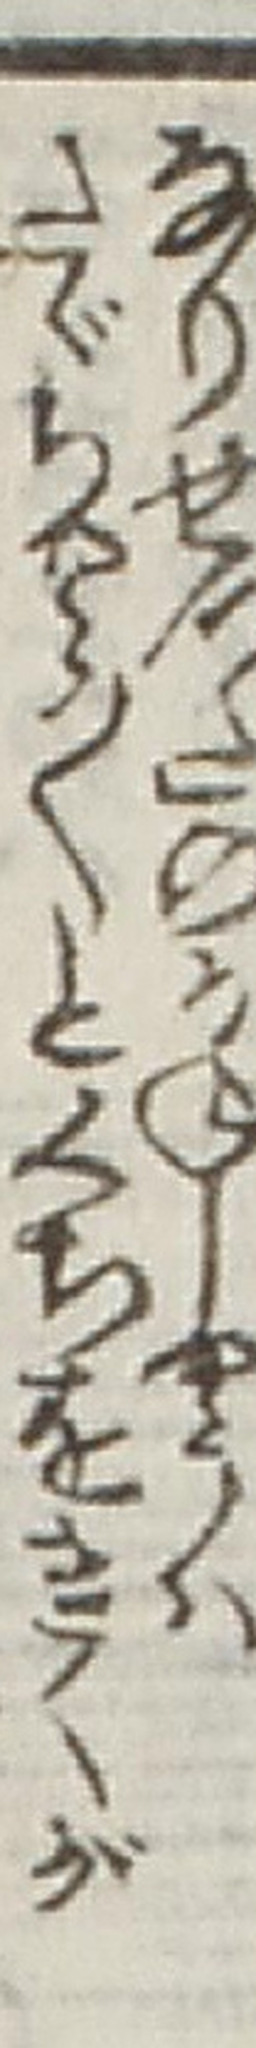たゞちやら〳〵とくちをきくが
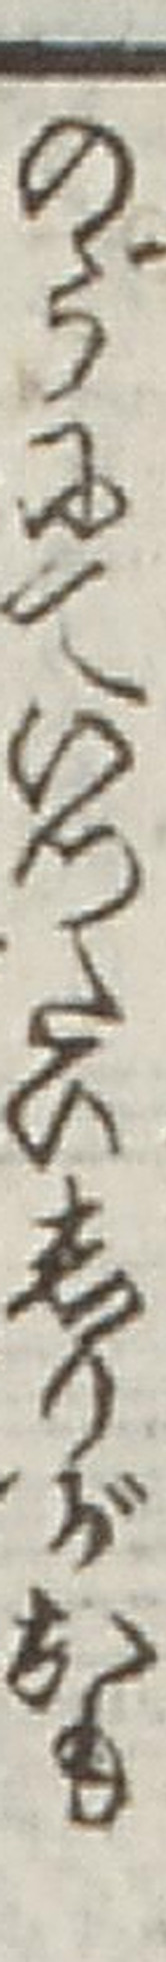のうにていつたいしりがおも
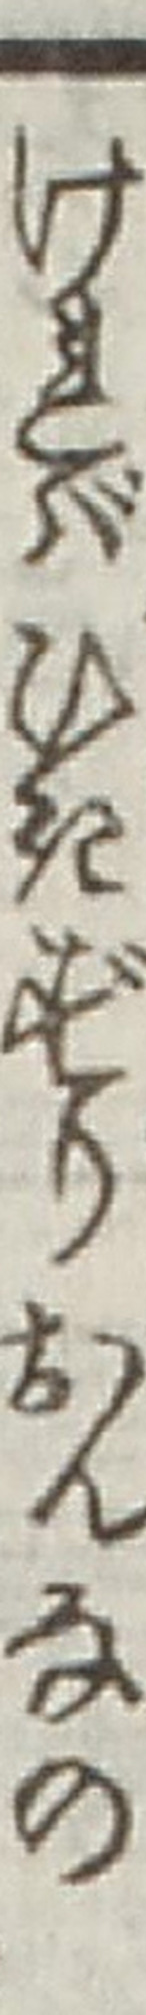ければひきずりおんなの
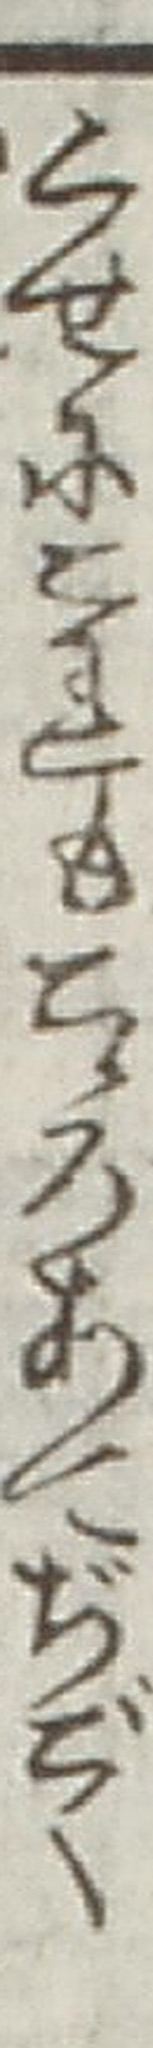くせにこれもこゝろあてにぢごく
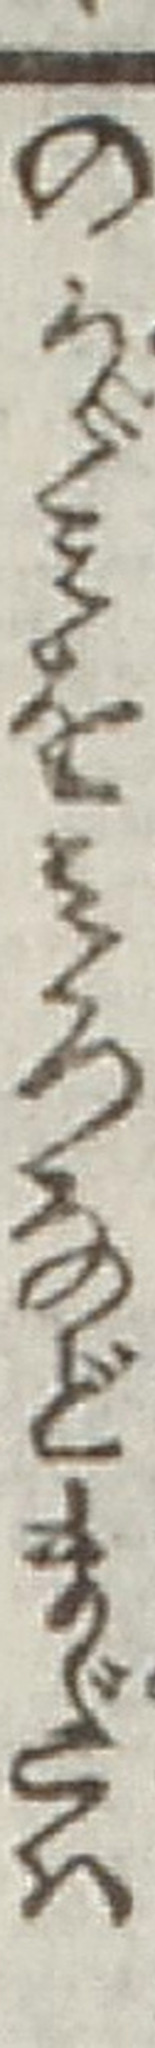のかゞみをみろなどまだは
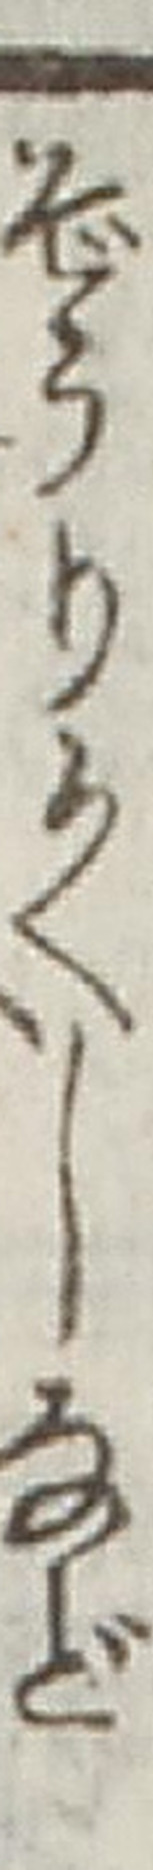ぞうりかくしなど
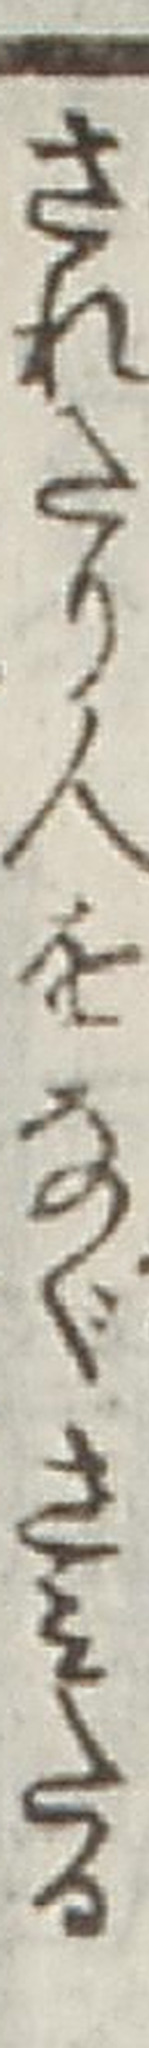されたり人をなぐさみたる
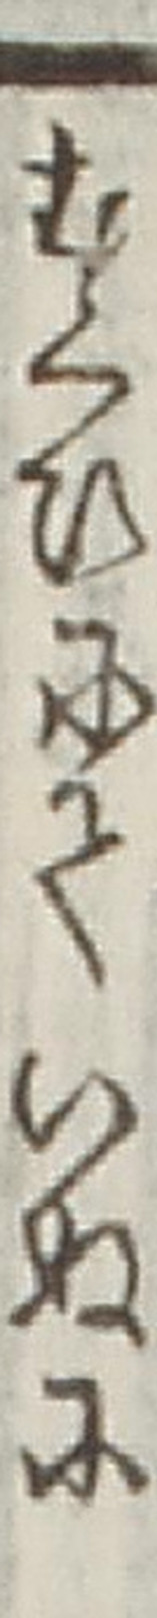むくひにていぬに
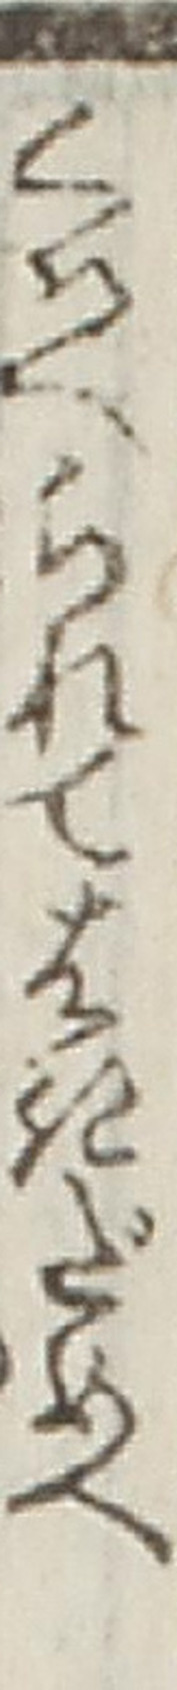くいくられてはきだめへ
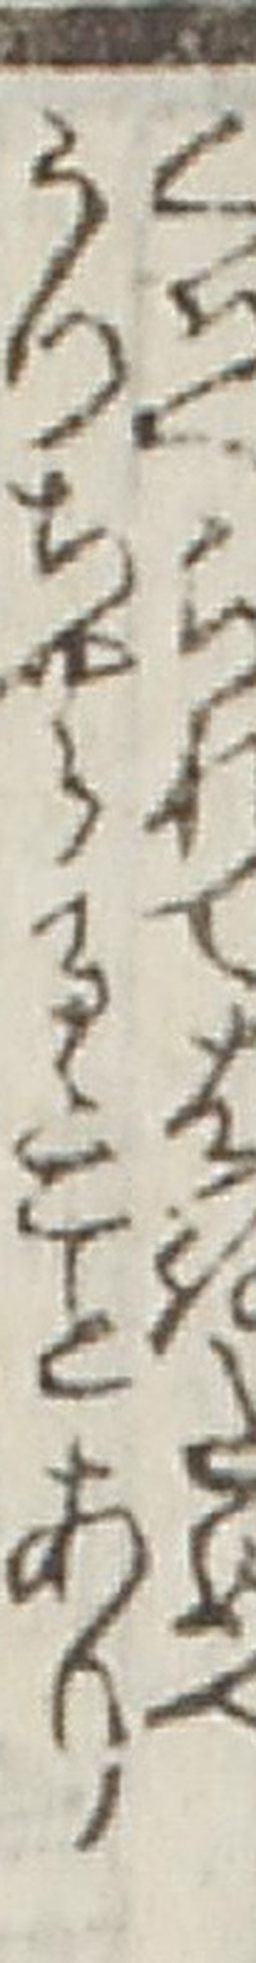うつちやらるゝことあり
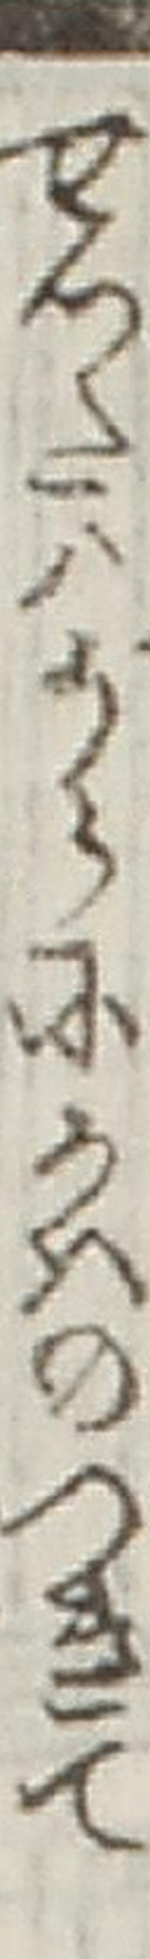せつたはうらにかはのつきて
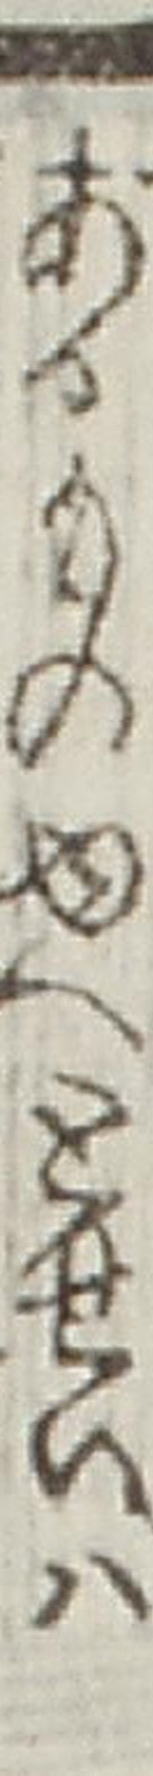あるものゆへとせいは
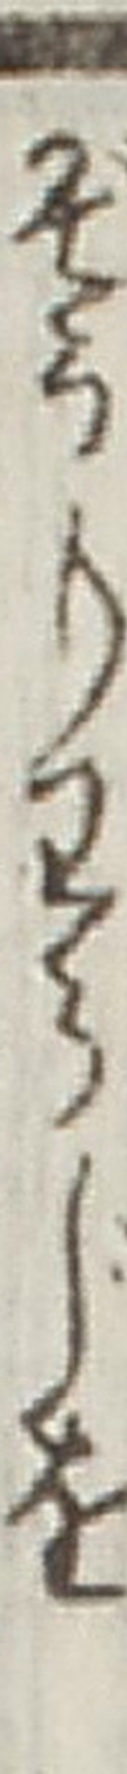ぞうりわらじを
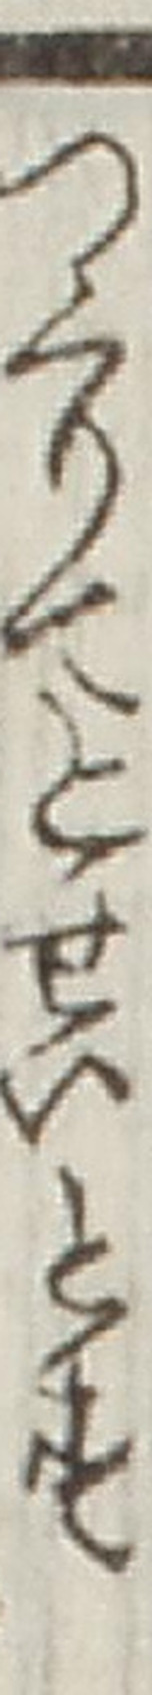つくりてとせいとす
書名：三世相出雲當座帳　上下冊
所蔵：東京大学地震研究所図書室 Earthquake Research Institute Library, The University of Tokyo, JAPAN
